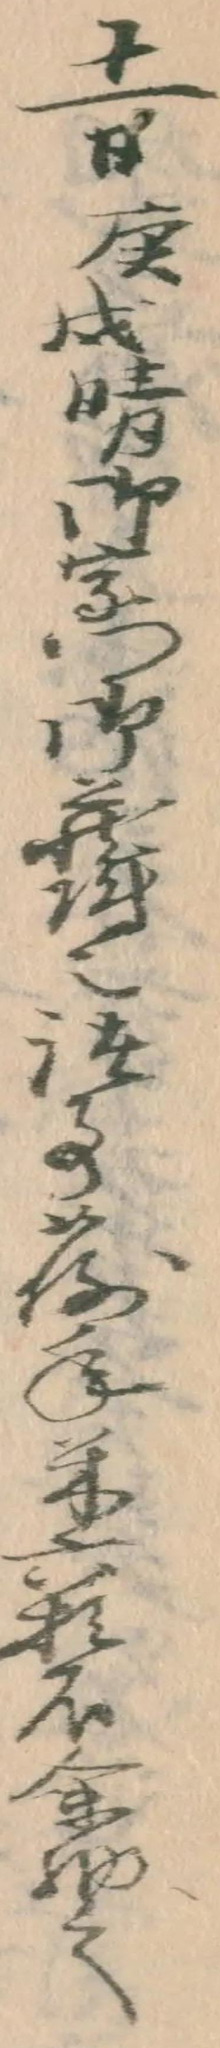十一日庚戌晴御家門御蔵掛也諸事如例年米六拾石余納也
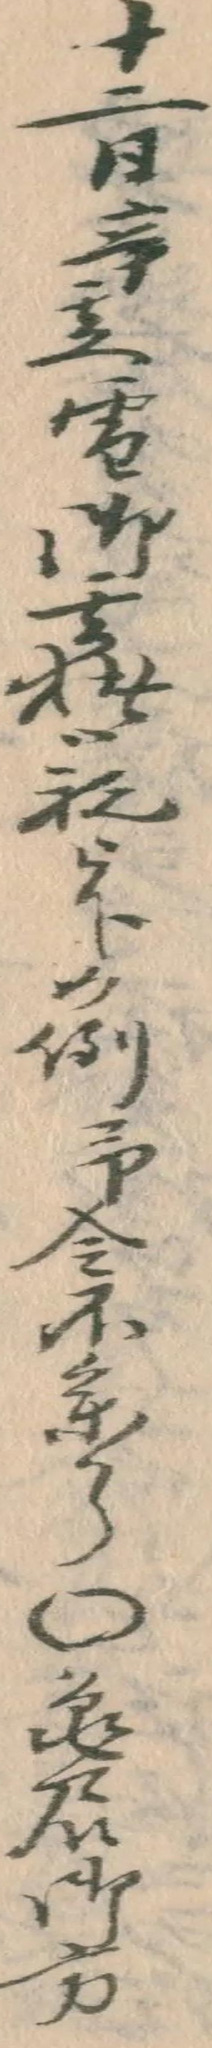十二日辛亥雪御玄猪御祝被下の例予令不参了○亀君御方
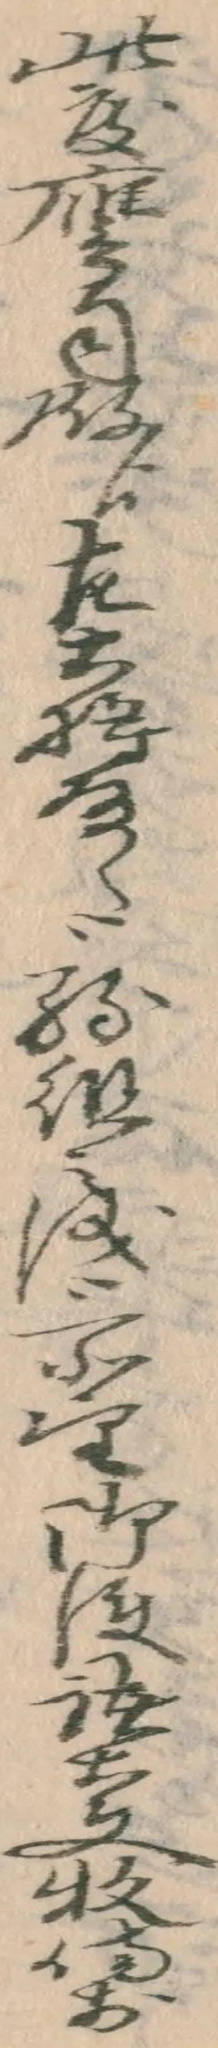此度鷹司殿ゟ左大将殿へ御縁組之儀御所望御渡諸大夫牧備前
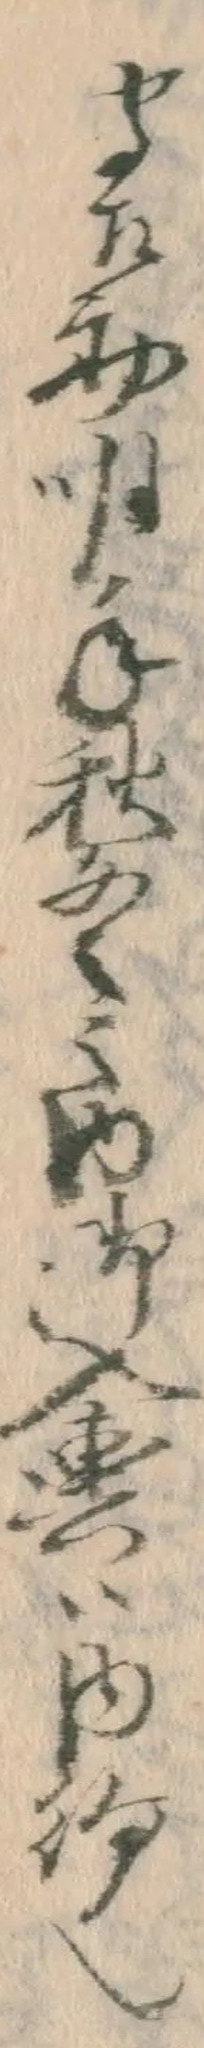守相勤明年秋冬之内御入輿御内約也
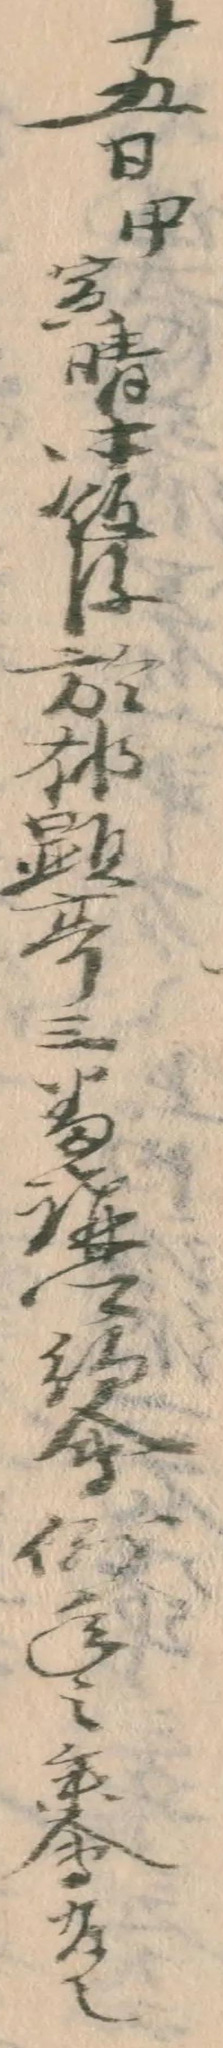十五日甲寅晴中飯後於郁顕亭三番講郷約會例年之参會有之
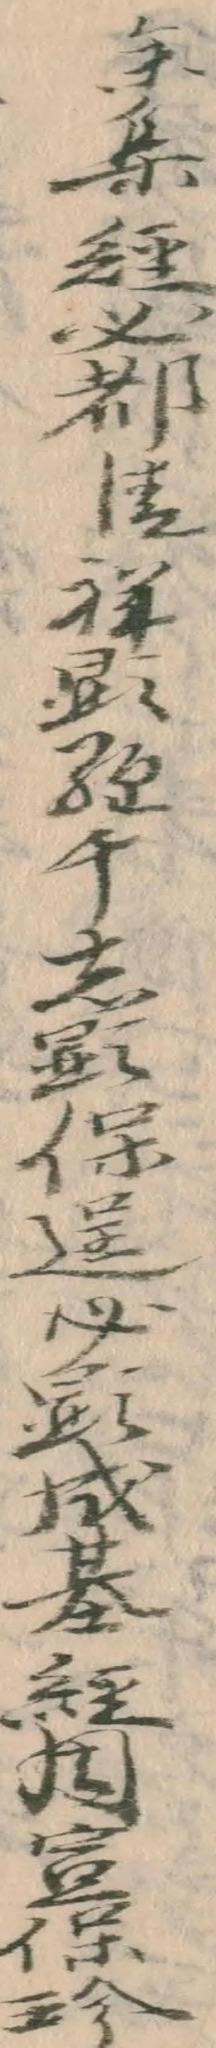参集経必都清祥顕経千志顕保逞必顕成基経周宣保珍
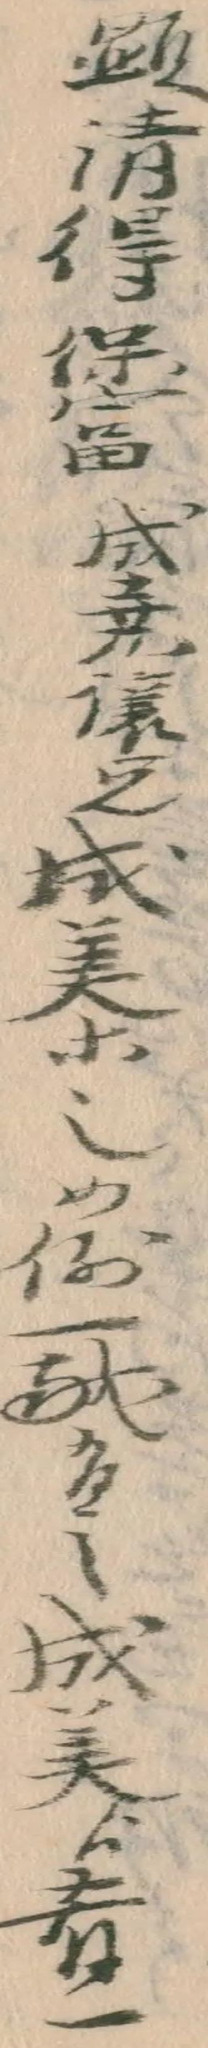顕清得保富成堯譲兄成美等也如例一献有之成美ゟ肴一
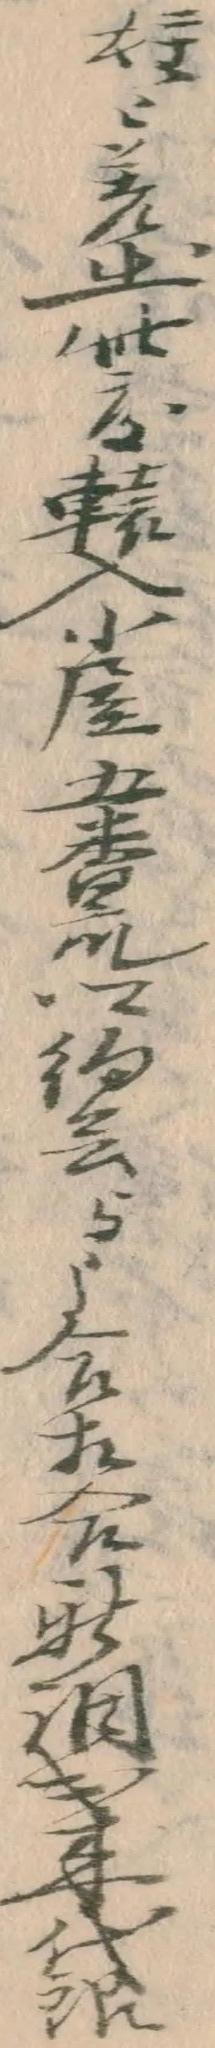種被差出此度轅入小屋五番衆郷約會と申合相合新調出来代銀
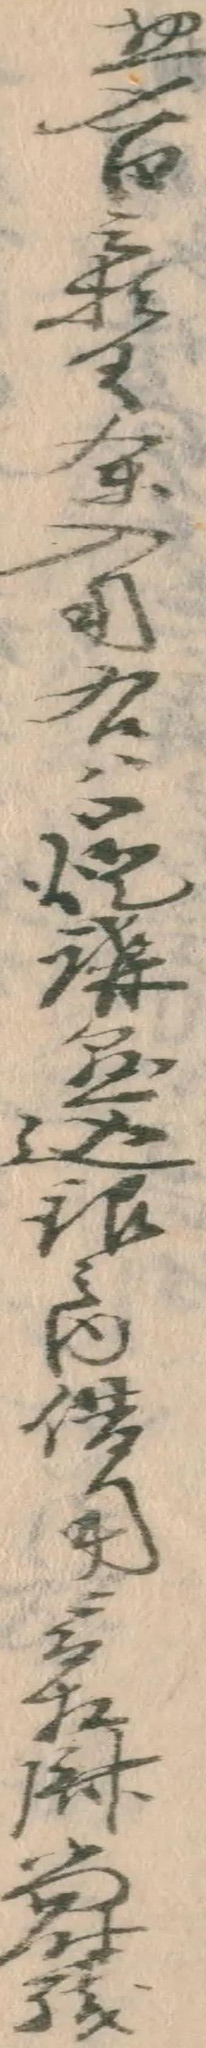惣〆百三拾匁余入用右ハ御燈講負込銀之内借用ニ而相済當時残
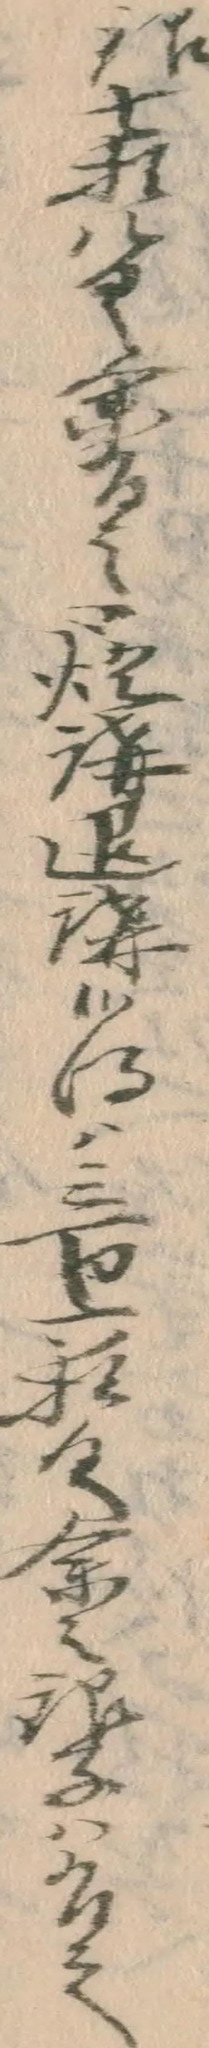銀七拾八匁之余有之御燈講退講候得ハ三百六拾匁余之銀子ハ有之
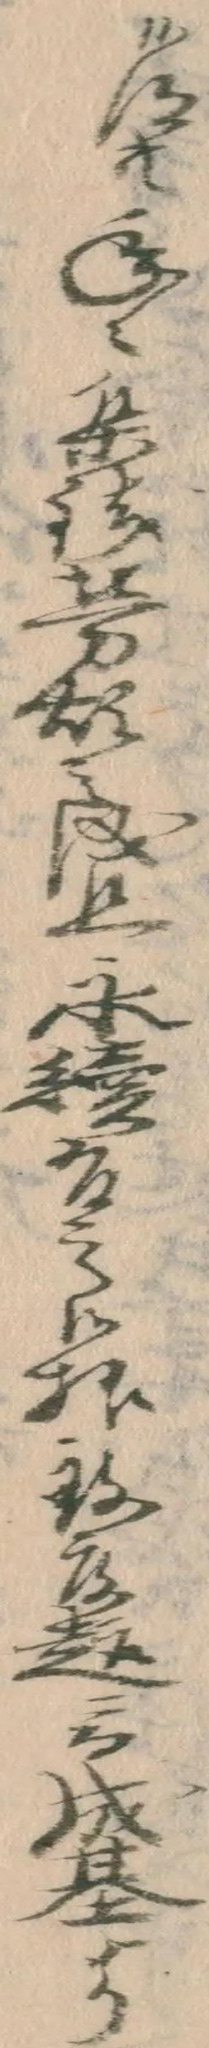候得共年々集銭労故之儀且永續有之候様致度趣ニ而成基より
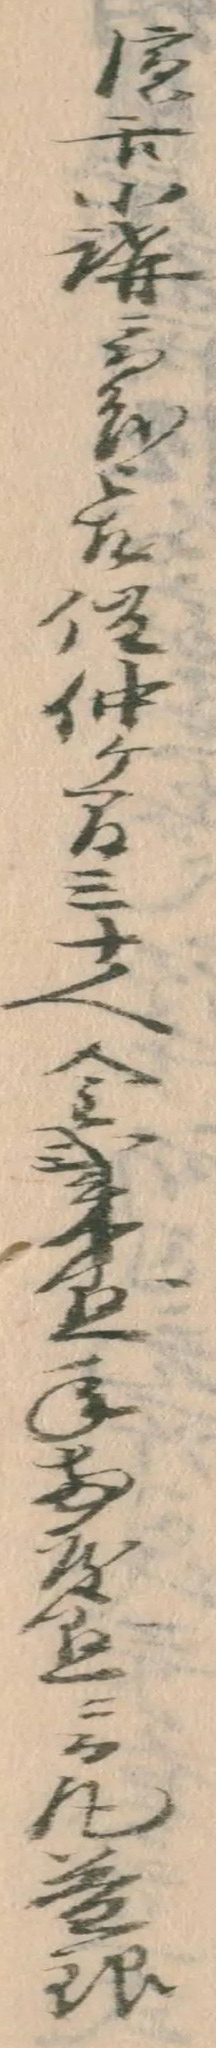濱舌小講ニ而も被存役仲ヶ間三十人金弐朱懸年前度通ニ而凡益銀
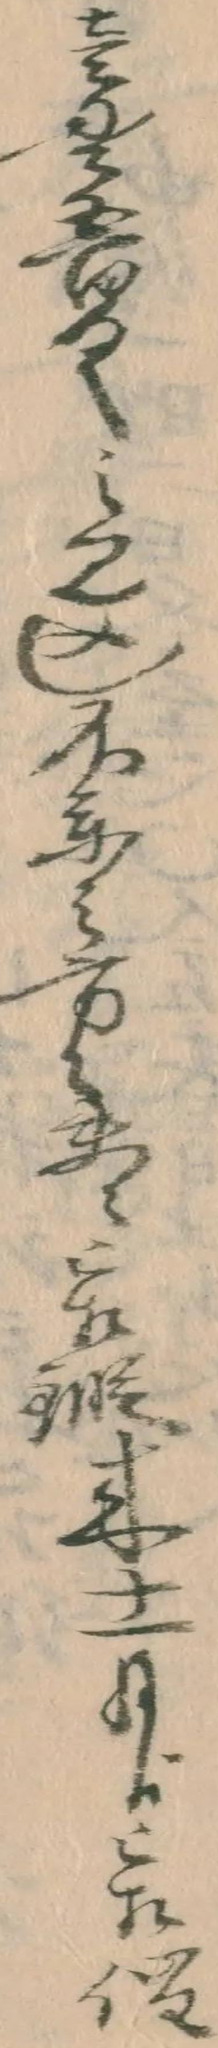壱貫五百文之見込不参之方々夫々被取越来十一月ゟ被相催
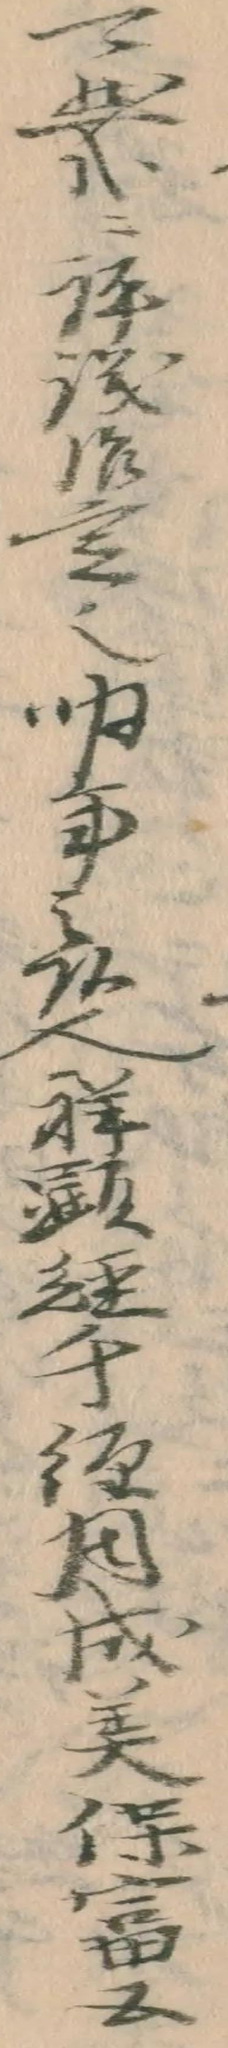可然哉一評議治定也明年之頭人祥顕経千経周成美保富五
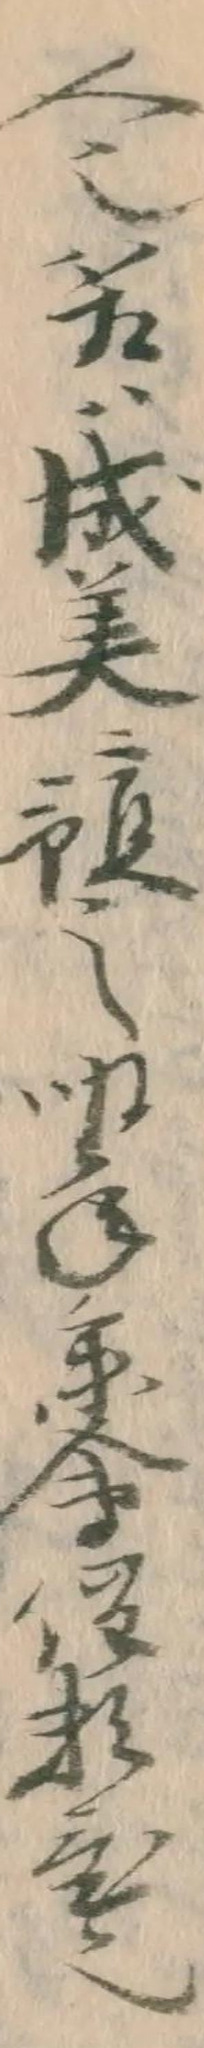人也箱ハ成美ニ預也明年参會役頼置也
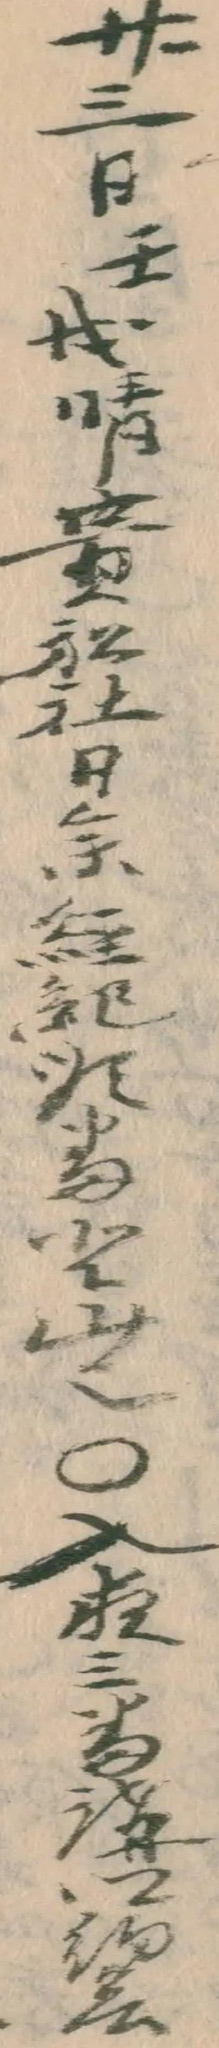廿三日壬戌晴宝舩社日参経記順番登山也〇入夜三番講郷約會
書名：賀茂社記録. 第69冊
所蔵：国立国会図書館 National Diet Library, JAPAN
